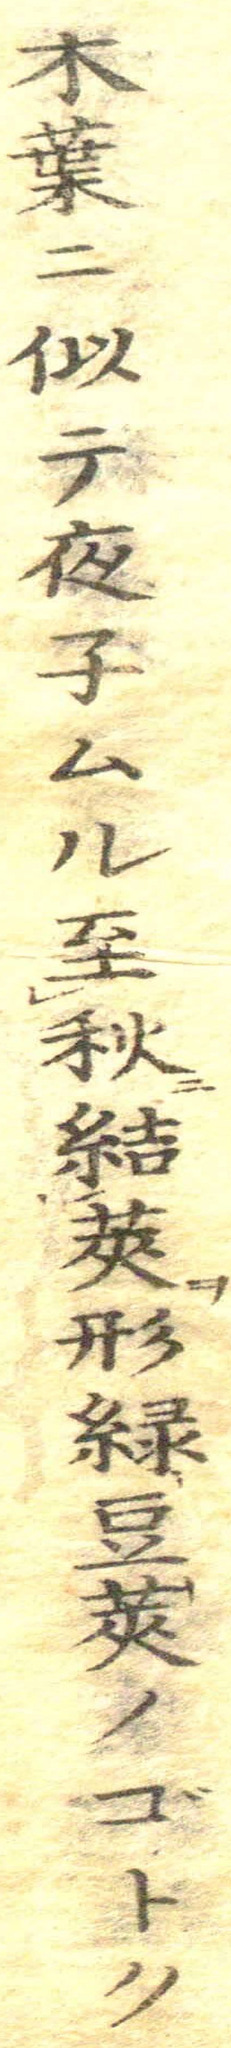木葉ニ似て夜ネムル至秋結莢形緑-豆-莢ノゴトク
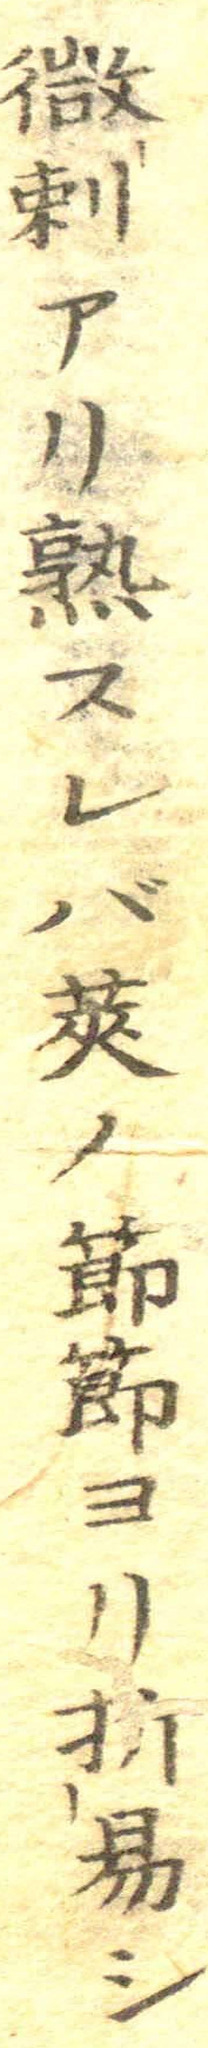微-刺アリ熟スレバ莢ノ節節ヨリ折-易シ
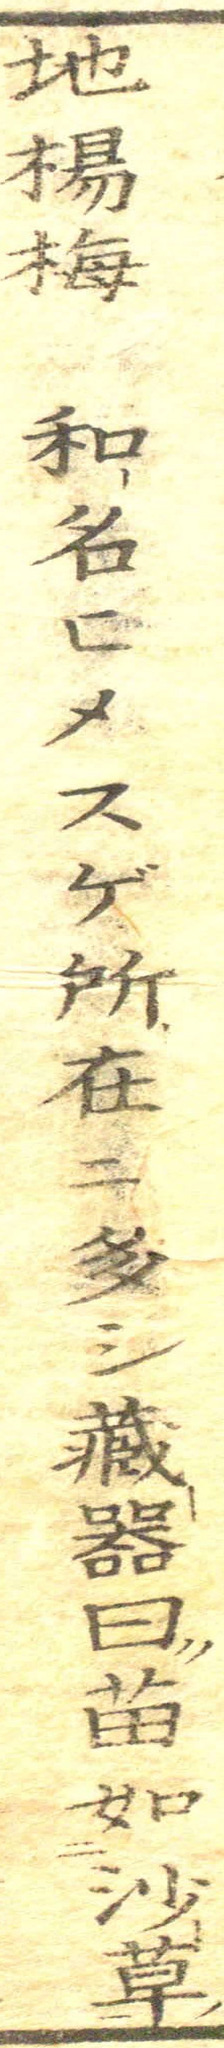地楊梅和-名ヒメスゲ所-在ニ多シ蔵-器曰苗如沙-草
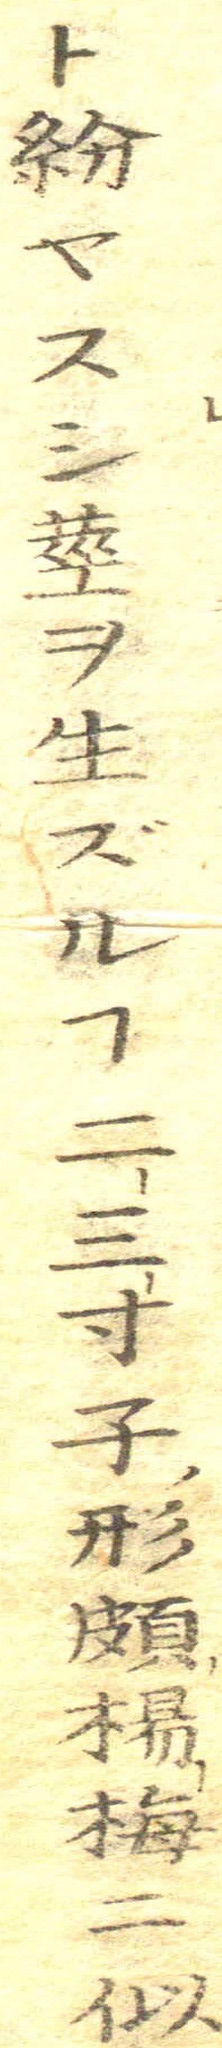ト紛ヤスシ茎ヲ生ズルコト二-三-寸子形頗楊-梅ニ似
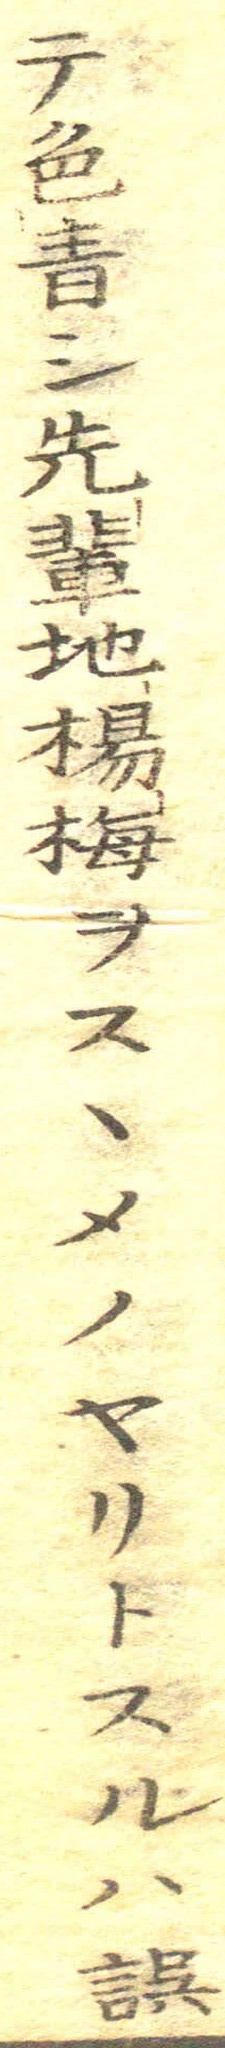テ色青シ先-輩地-楊-梅ヲスヽメノヤリトスルハ誤
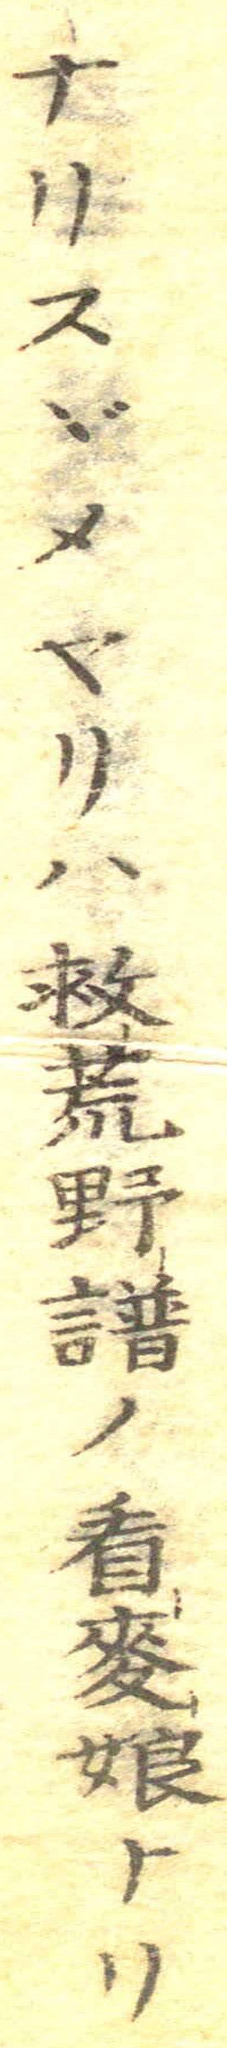ナリスヾメヤリハ救荒野譜ノ看-麦-娘ナリ
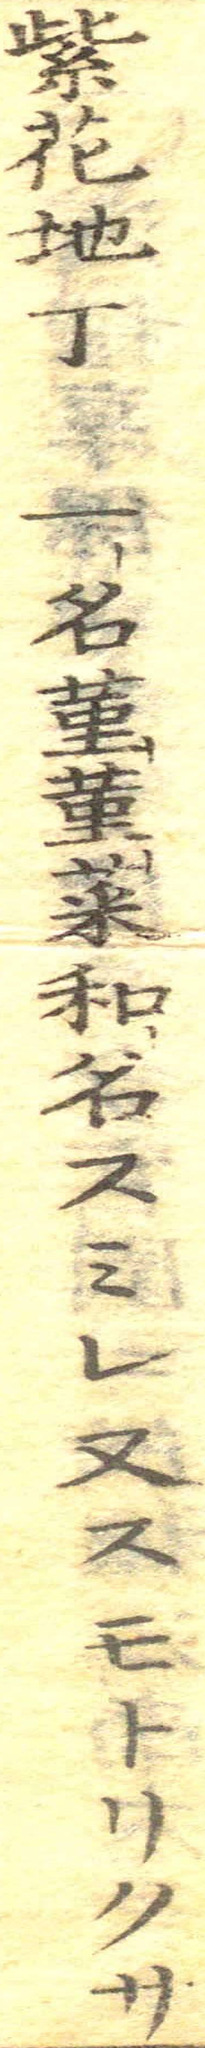紫花地丁一-名菫-菫-名和-名スミレ又スモトリクサ
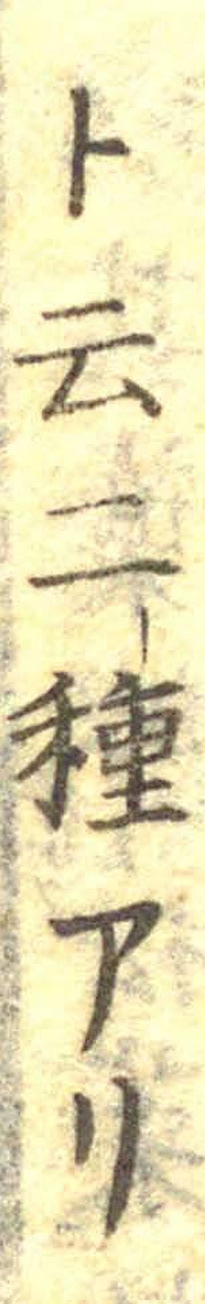ト云二-種アリ
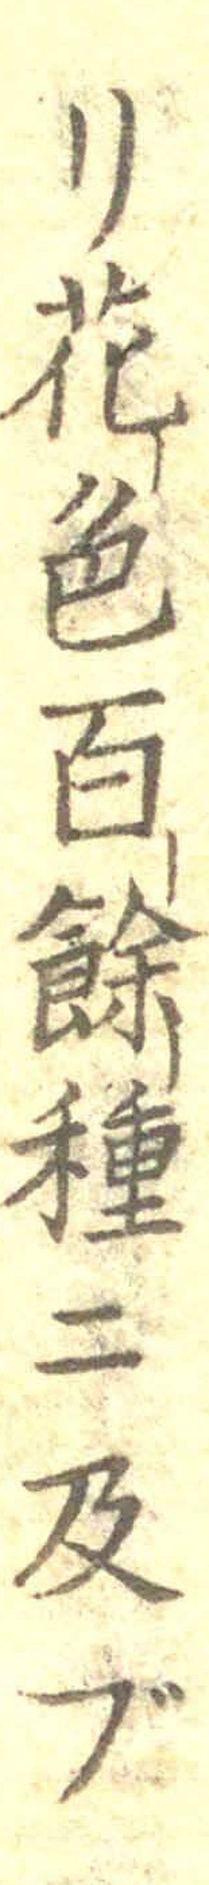リ花-色百-余-種ニ及ブ
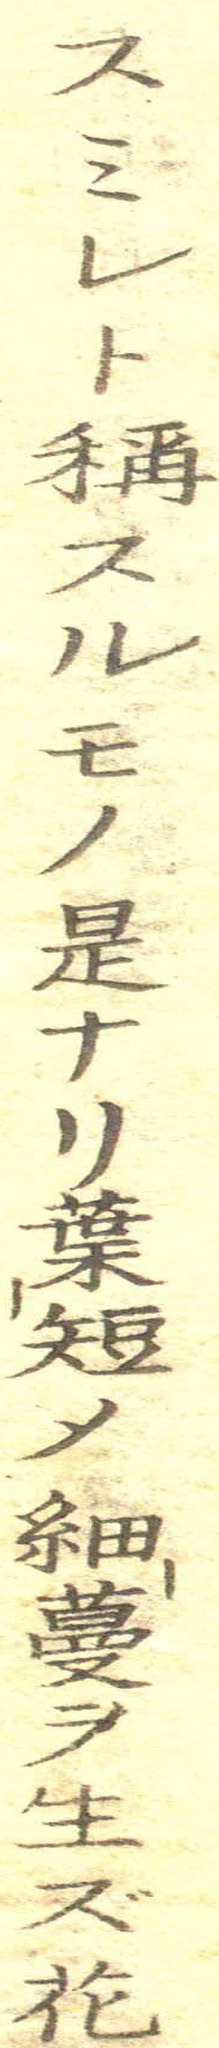スミレト称スルモノ是ナリ葉-短シテ細-蔓ヲ生ズ花
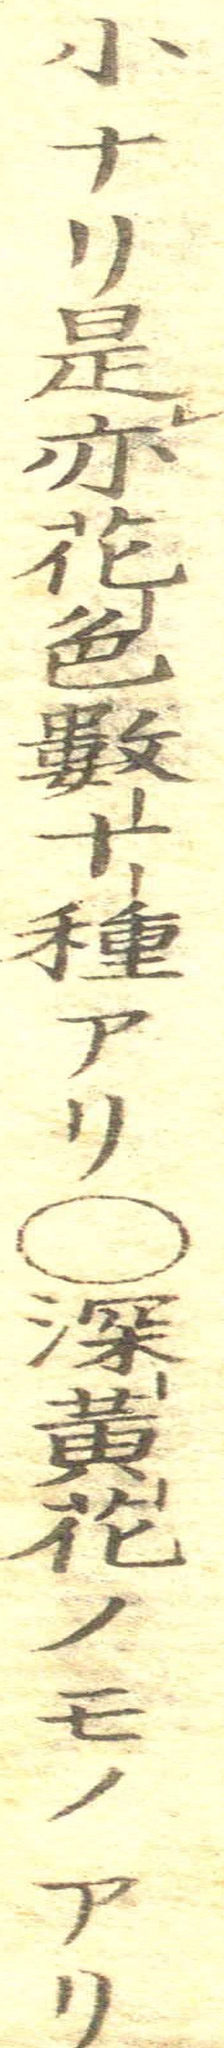小ナリ是亦花-色数-十-種アリ○深-黄-花ノモノアリ
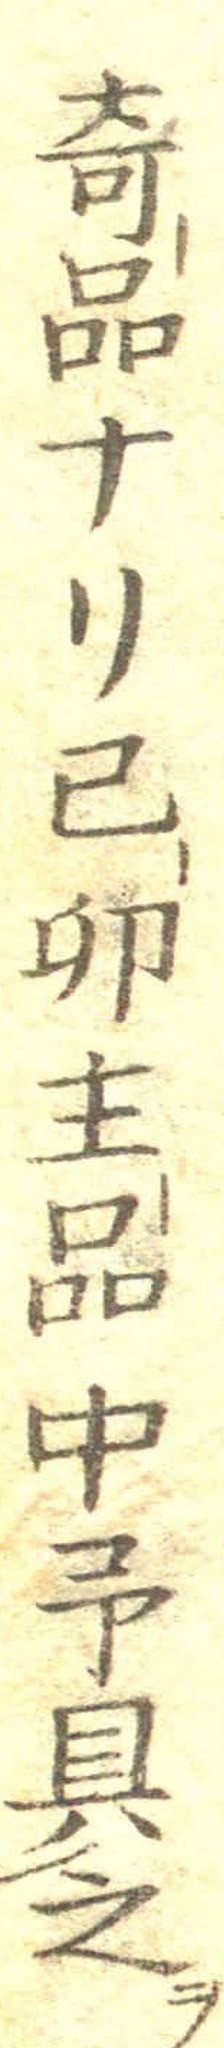奇-品ナリ已-卯主-品中予具之
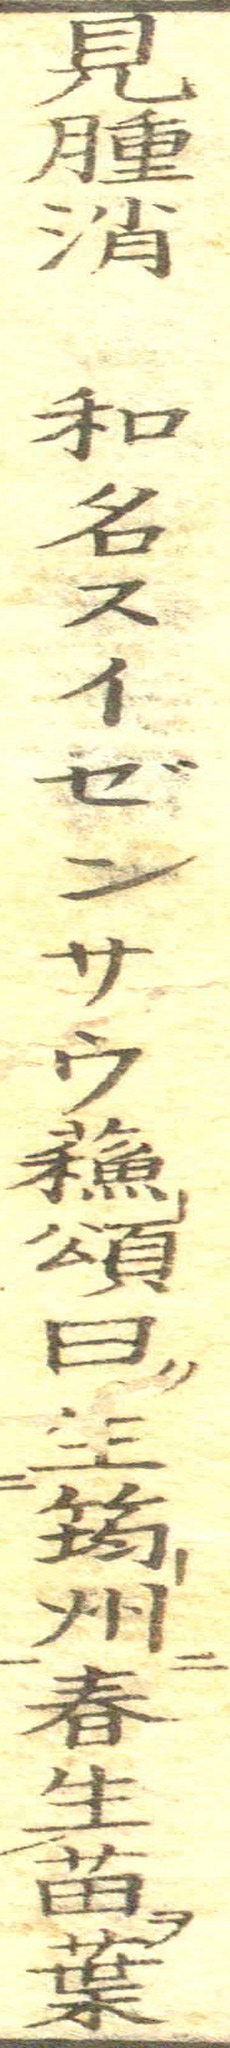見腫消和名スイゼンサウ蘇-頌曰生筠-州春生苗葉
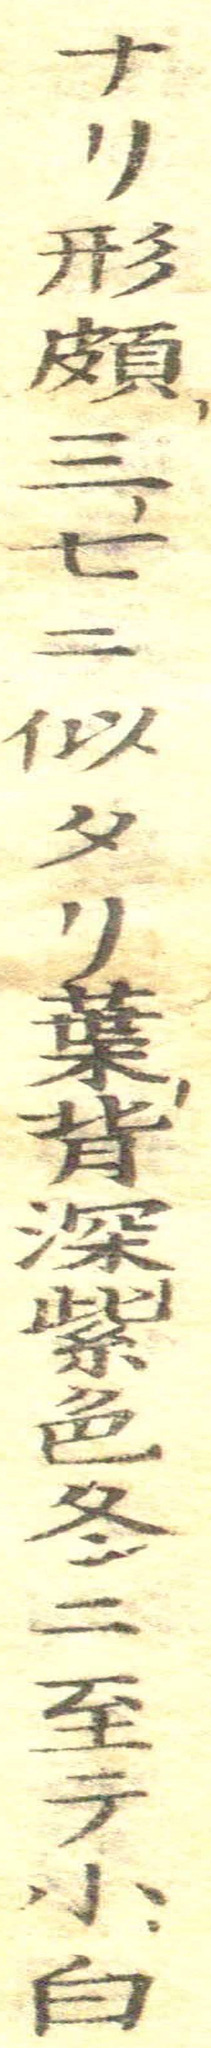ナリ形頗三-七ニ似タリ葉-ノ背深-紫色冬ニ至テ小-白

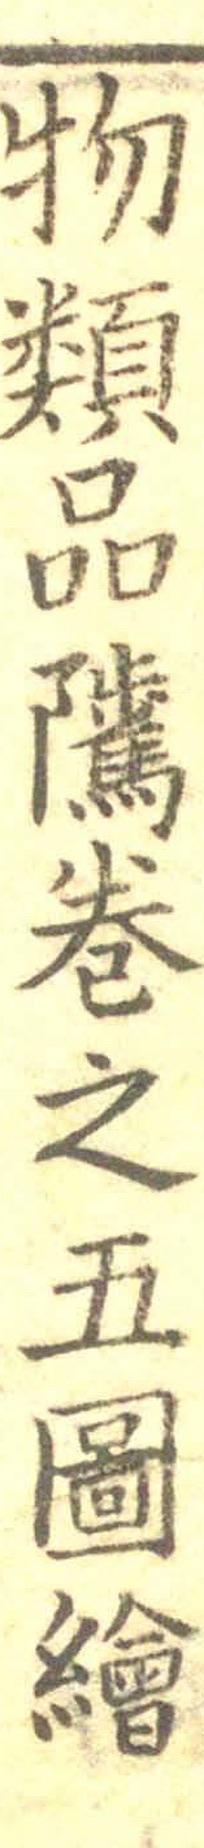物類品隲巻之五図絵
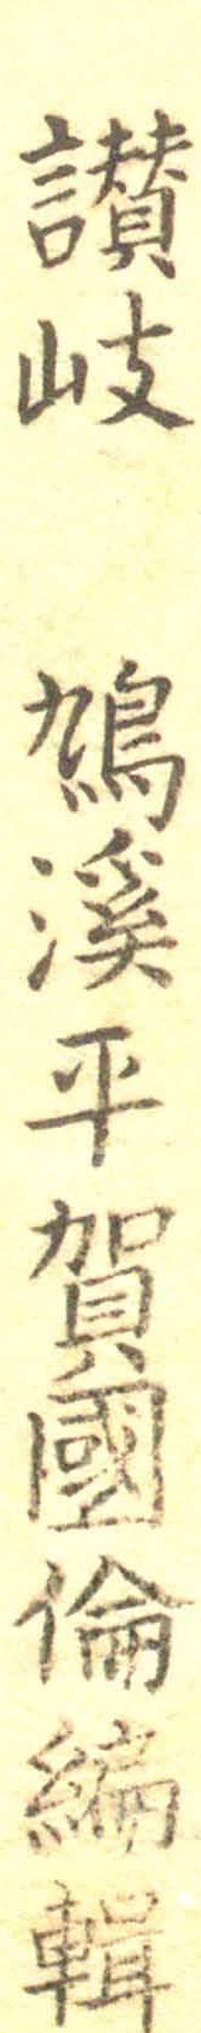讃岐鳩渓平賀国倫編輯
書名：物類品隲
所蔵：国文学研究資料館
